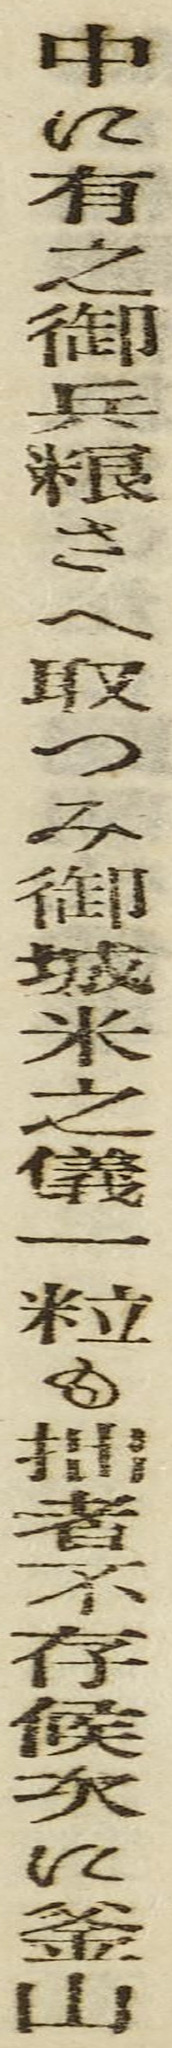中に有之御兵糧さへ取つみ御城米之儀一粒も拙者不存候次に釜山
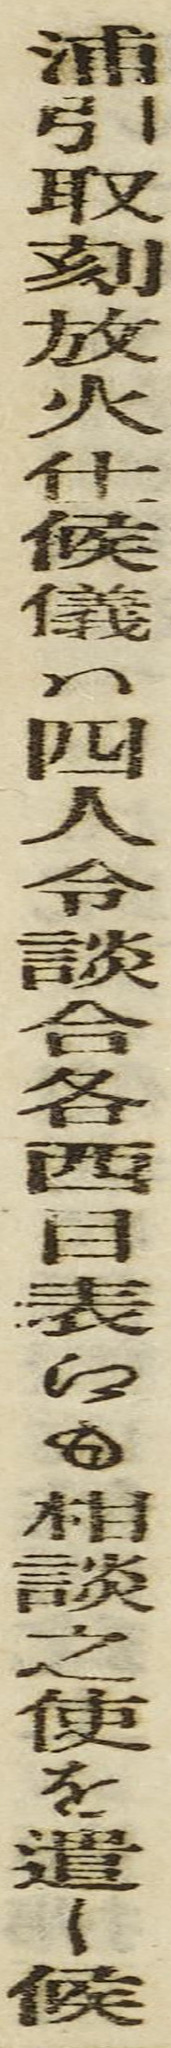浦引取刻放火仕候儀は四人令談合各西目表えも相談之使を遣し候

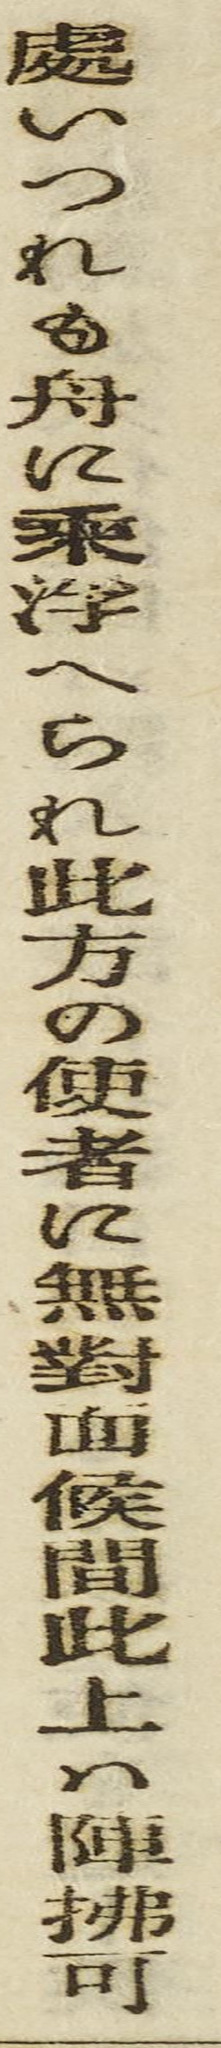処いつれも舟に乗浮へられ此方の使者に無対面候間此上は陣払可
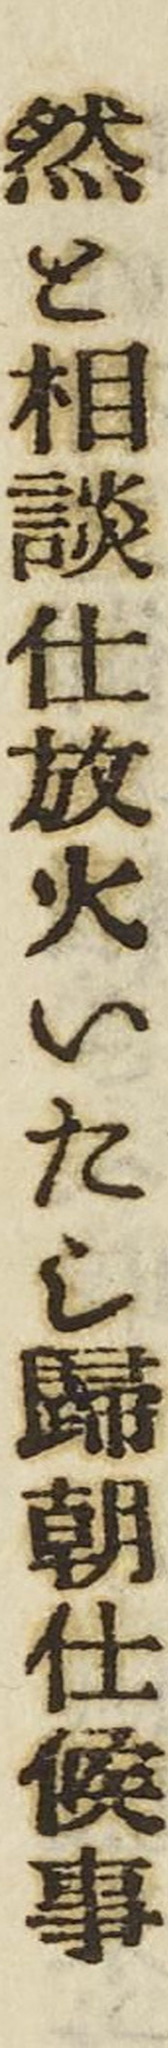然と相談仕放火いたし帰朝仕候事
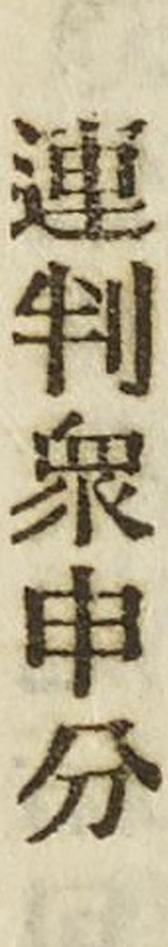連判衆申分
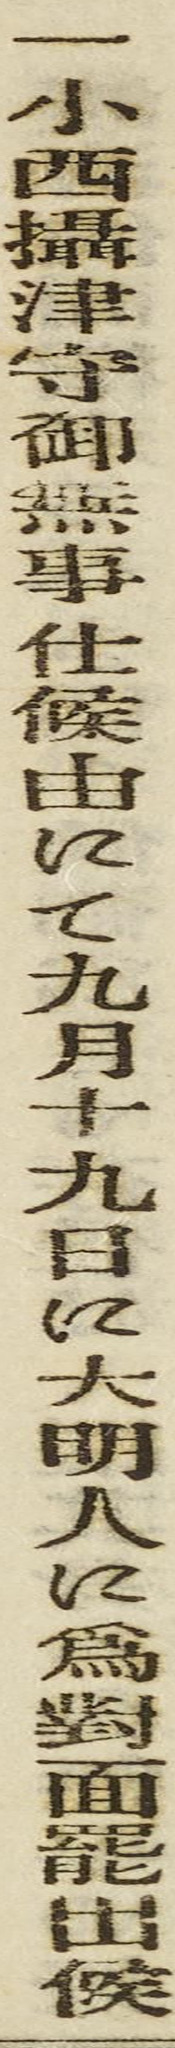一小西摂津守御無事仕候由にて九月十九日に大明人に為対面罷出候
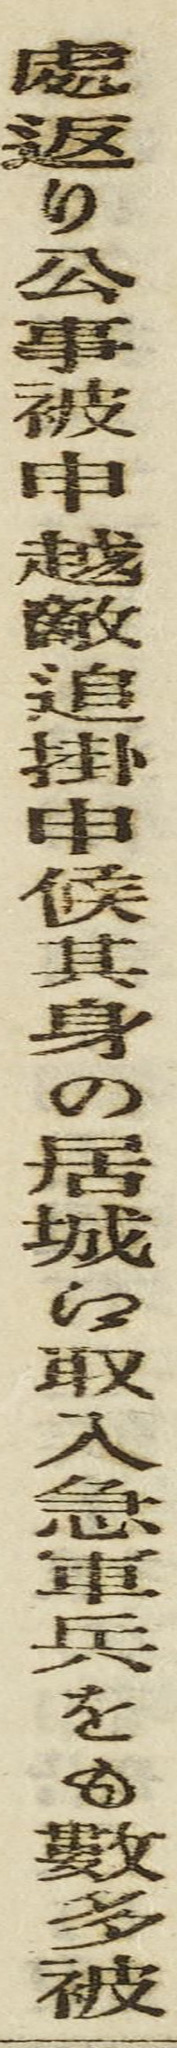処返り公事被申越敵追掛申候其身の居城え取入急軍兵をも数多被
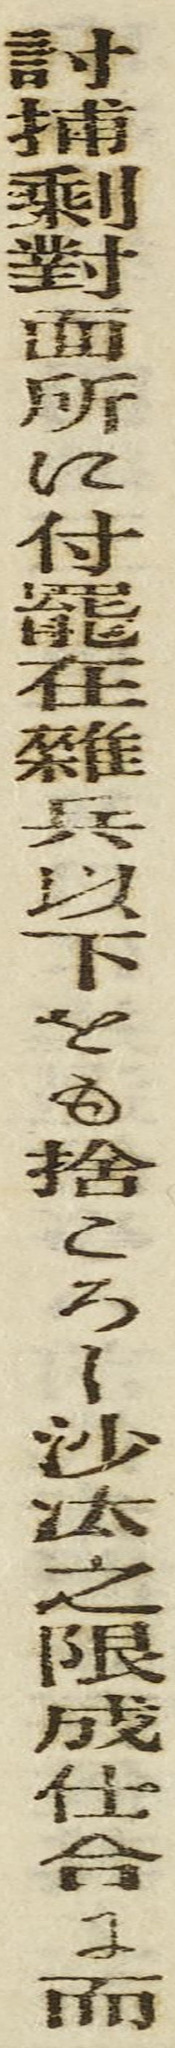討捕剰対面所に付罷在雑兵以下をも捨ころし沙汰之限成仕合に而
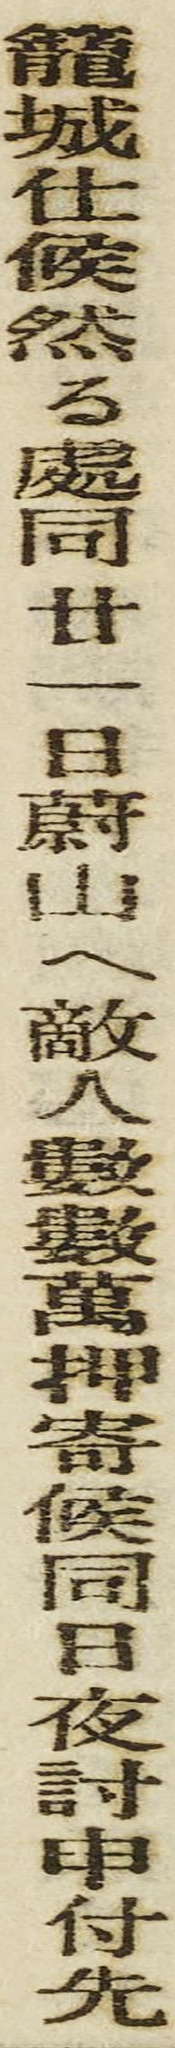籠城仕候然る処同廿一日蔚山へ敵人数数万押寄候同日夜討申付先
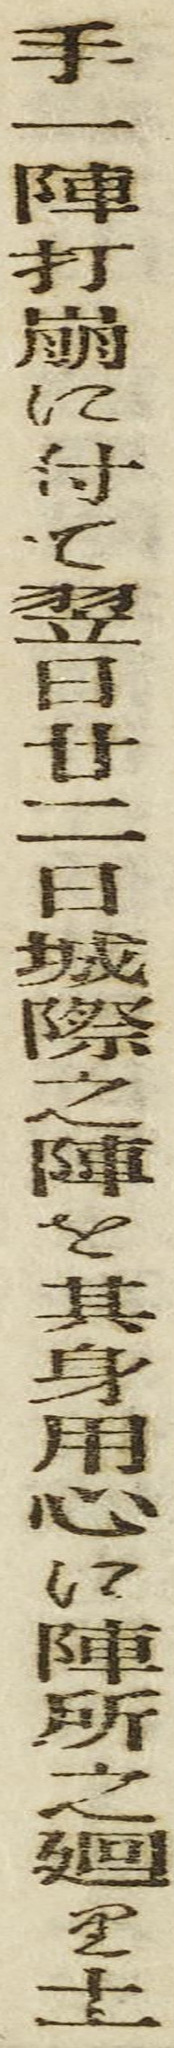手一陣打崩に付て翌日廿二日城際之陣を其身用心に陣所之廻り土
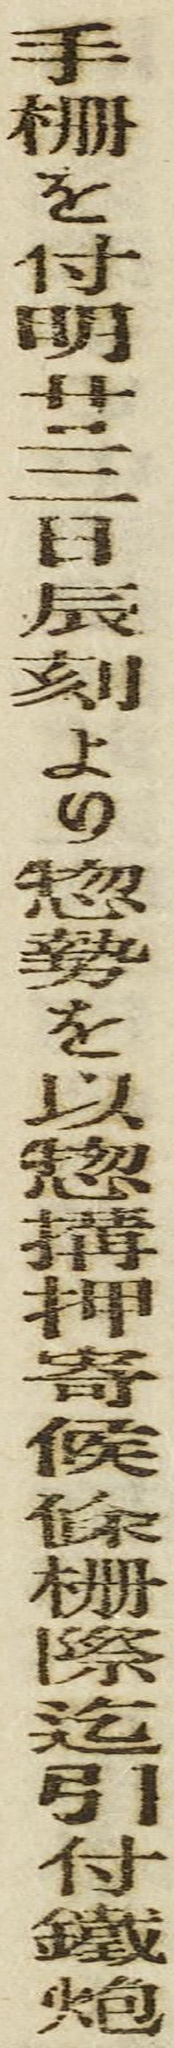手柵を付明廿三日辰刻より惣勢を以惣搆押寄候条柵際迄引付鉄炮
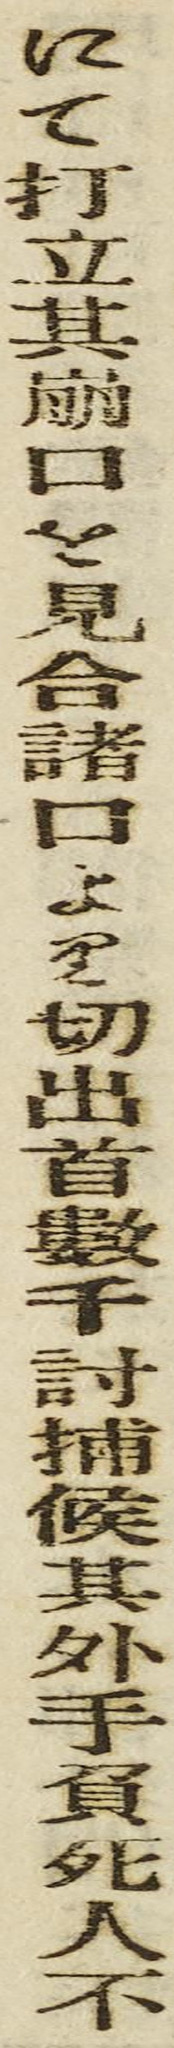にて打立其崩口を見合諸口より切出首数千討捕候其外手負死人不
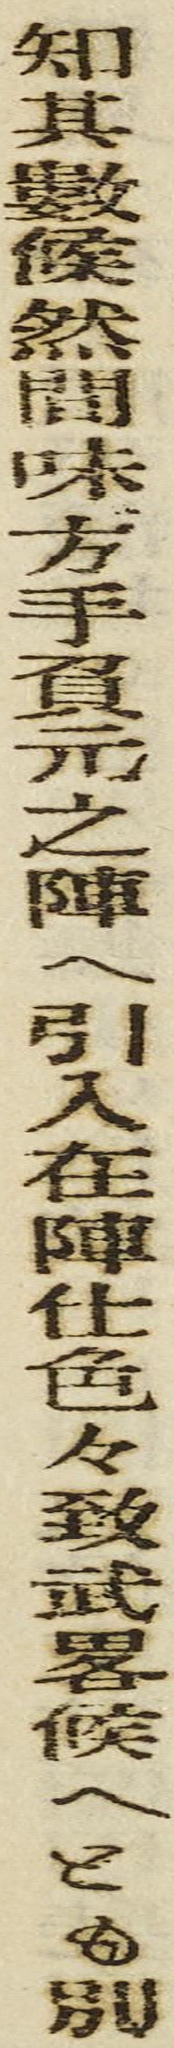知其数候然間味方手負元之陣へ引入在陣仕色々致武略候へとも別
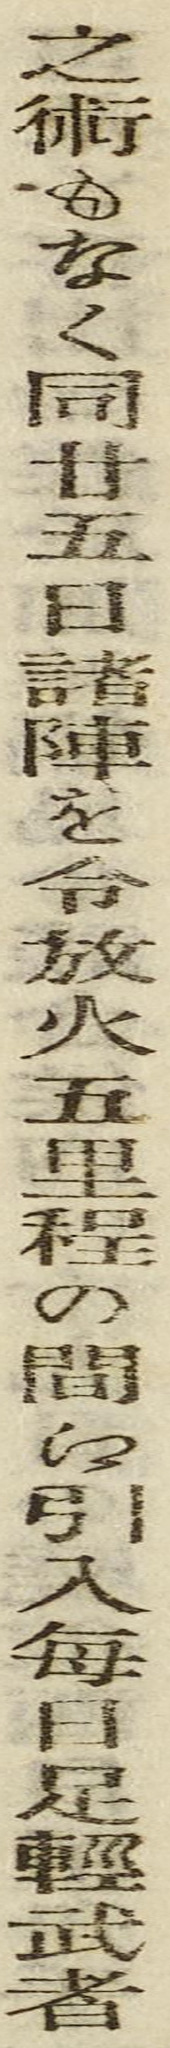之術もなく同廿五日諸陣を令放火五里程の間え引入毎日足軽武者
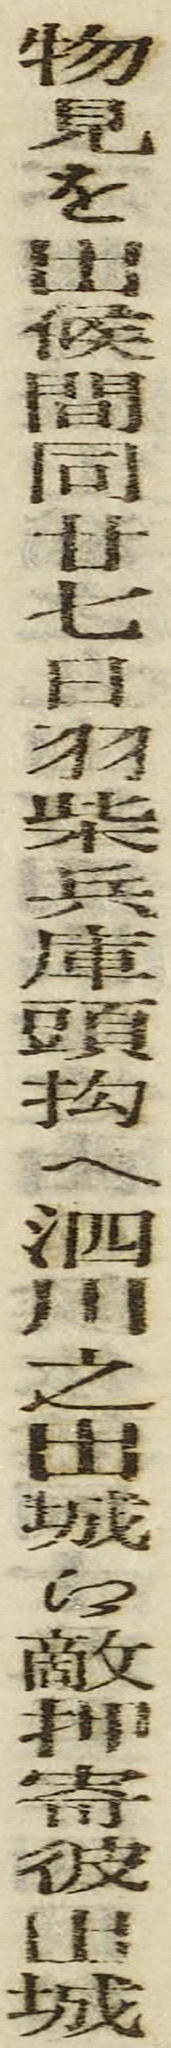物見を出候間同廿七日羽柴兵庫頭抅へ泗川之出城え敵押寄彼出城
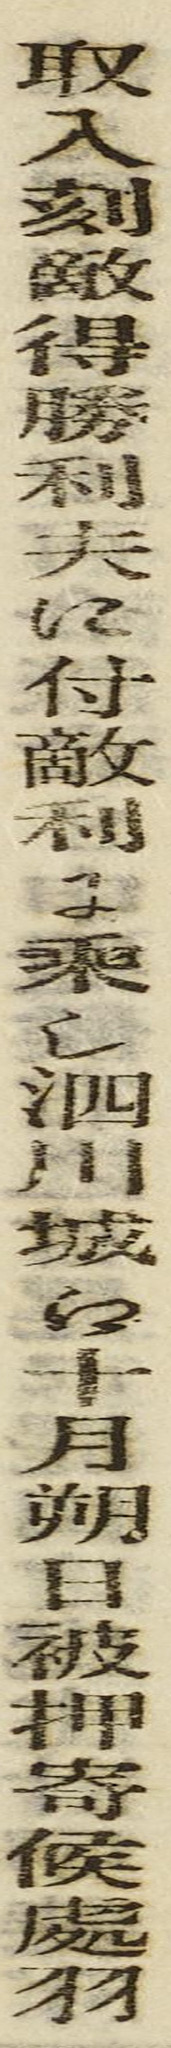取入刻敵得勝利夫に付敵利に乗し泗川城え十月朔日被押寄候処羽
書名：史籍集覽　朝鮮陣古文・細井廣澤記・颶風紀事・天明七年將軍宣下次第書　全
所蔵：東京大学地震研究所図書室 Earthquake Research Institute Library, The University of Tokyo, JAPAN
